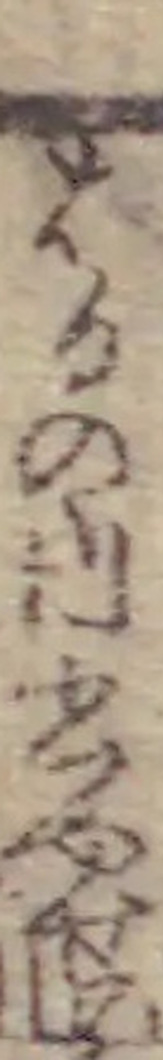はるの内書やせう
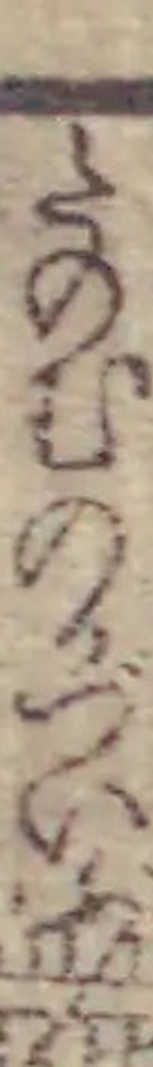たのむのかづいぶん
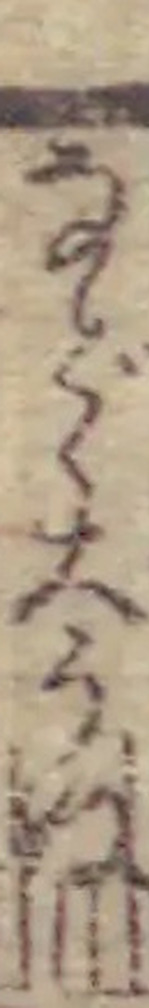などゝ大うぬ
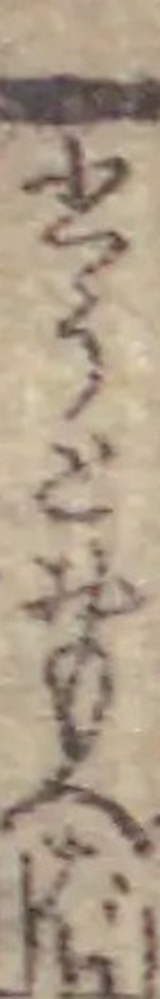書うとおもへば
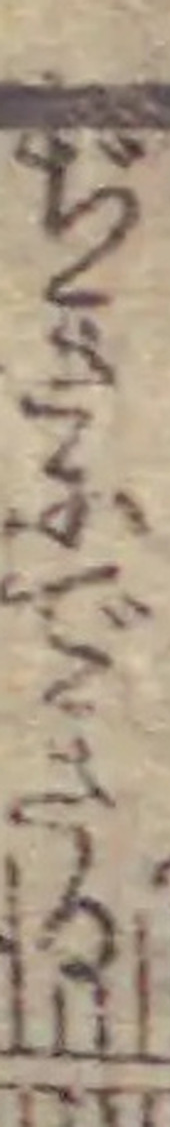ぢきにできる
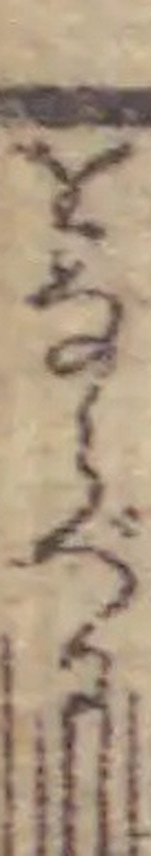をならべる

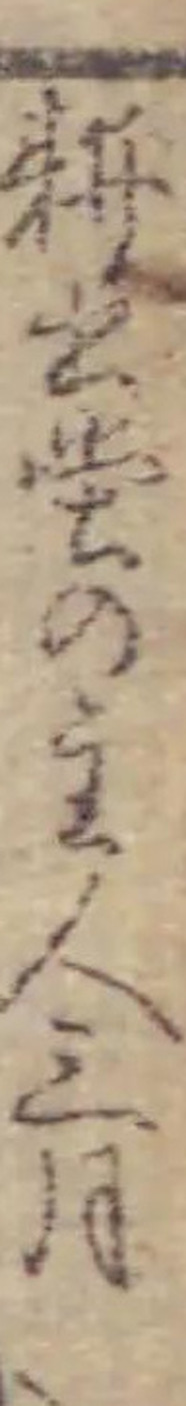耕書堂の主人三月
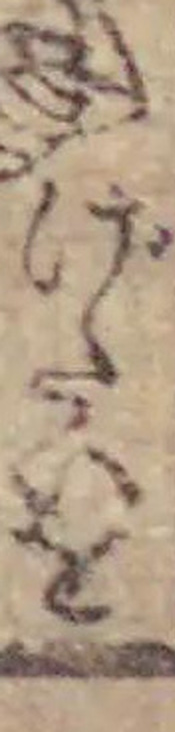げたいを
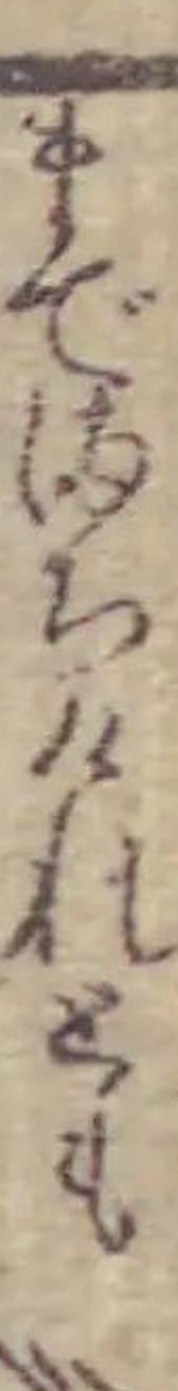までまちけれとも
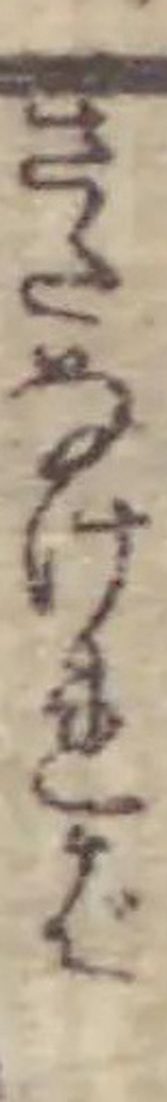さたなければ
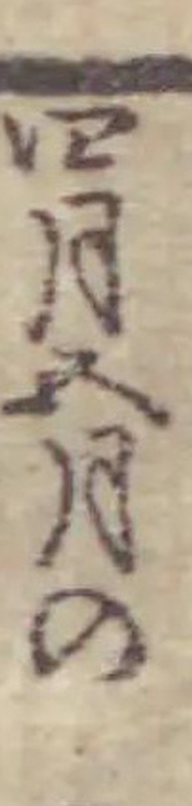四月五月の
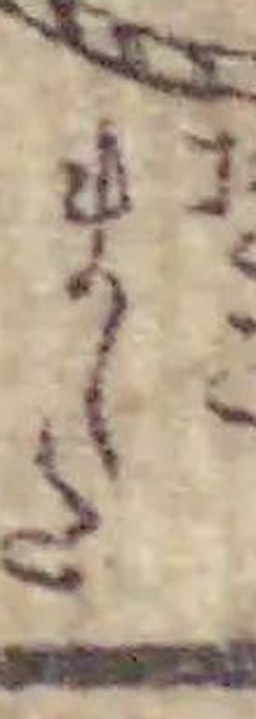ました
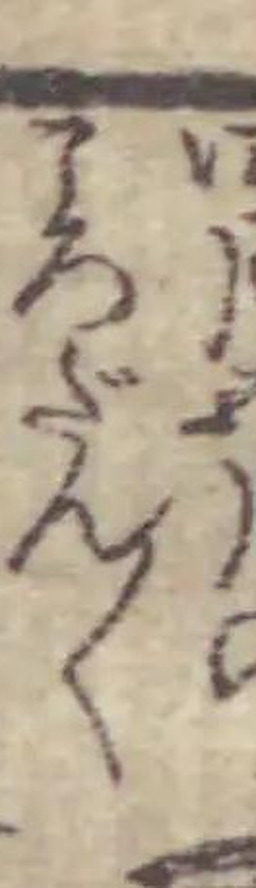ころだん〳〵
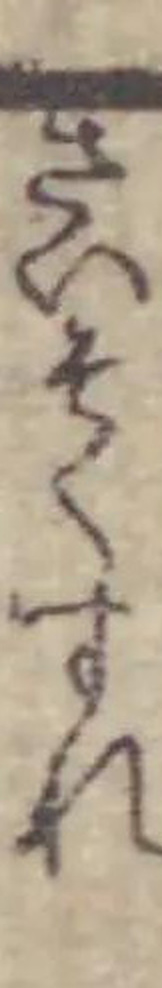さいそくすれ
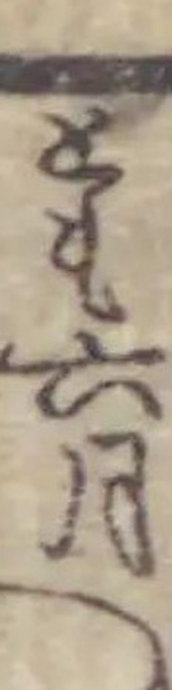とも六月
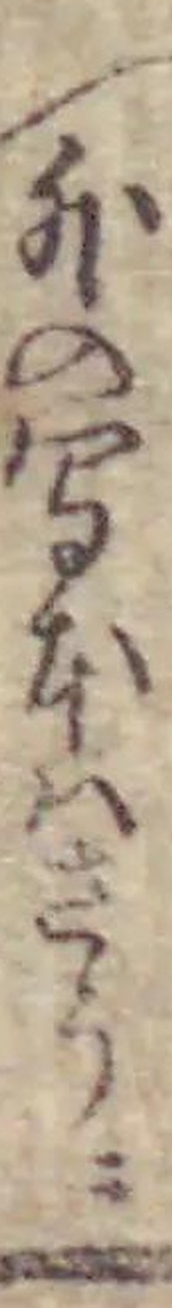外の写本はさらに
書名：亀山人家妖 3巻
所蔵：国立国会図書館 National Diet Library, JAPAN
